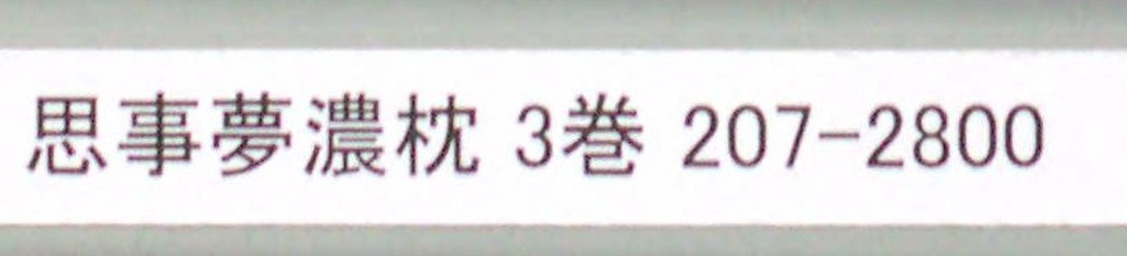思事夢の枕全
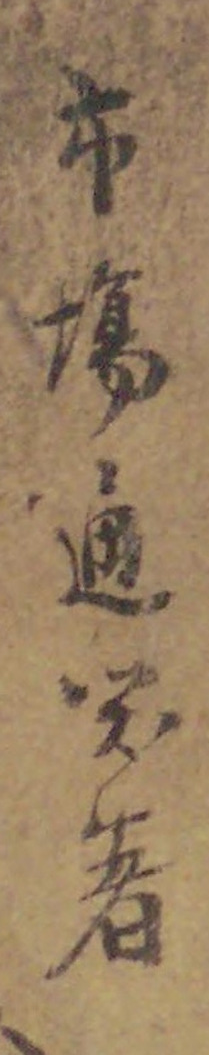市場通笑著

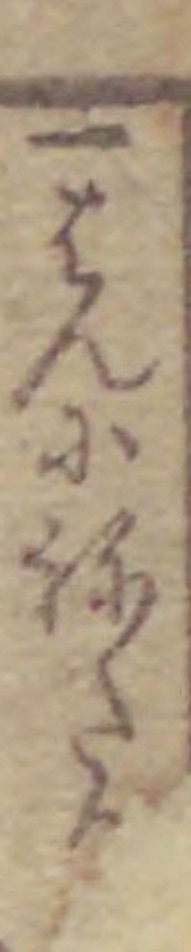一はんにねたる
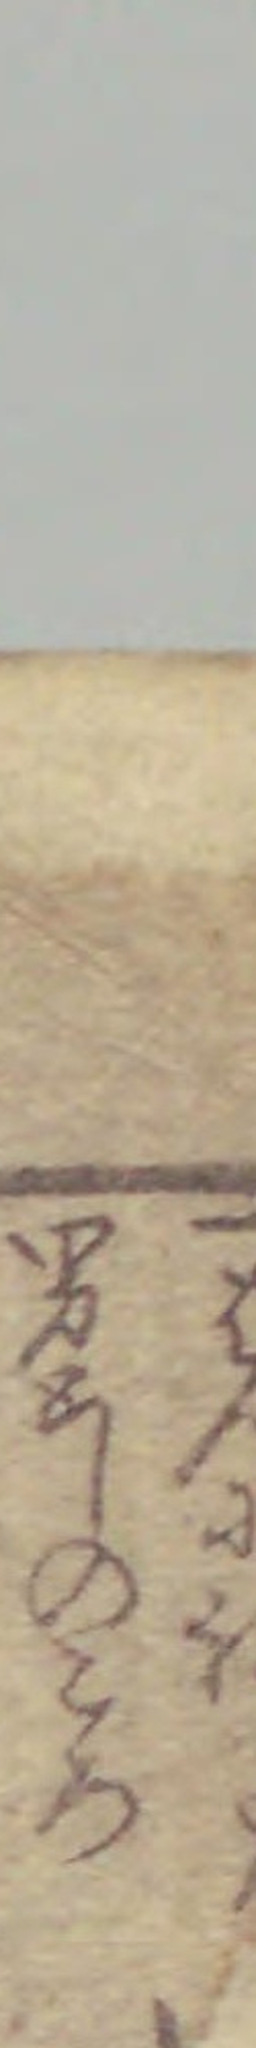男としのころ
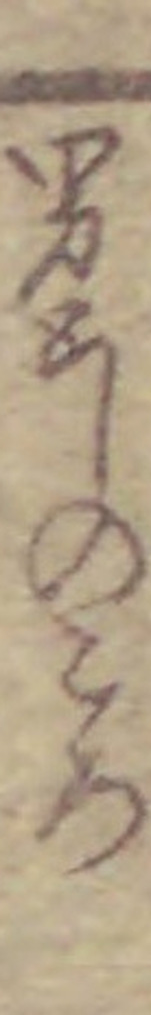男としのころ
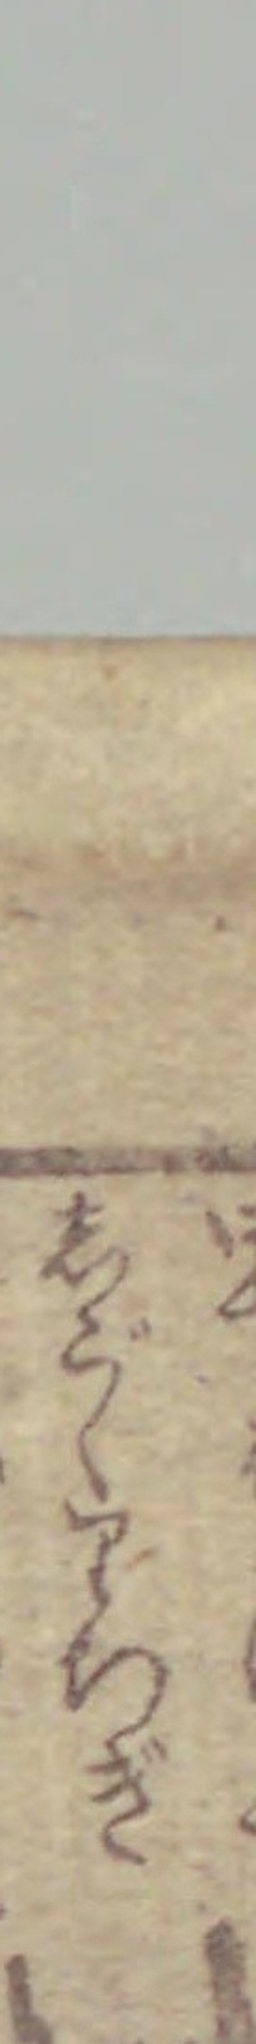しごくりちぎ
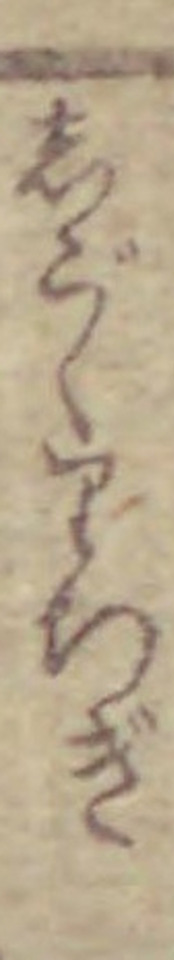しごくりちぎ
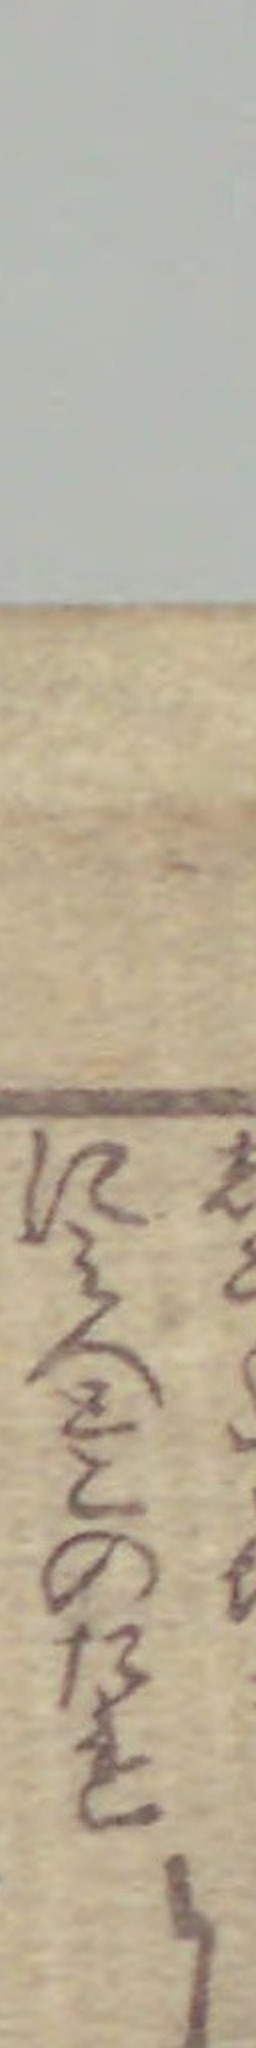にみへとこのたれ
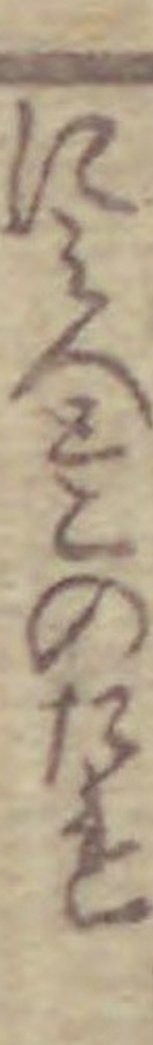にみへとこのたれ
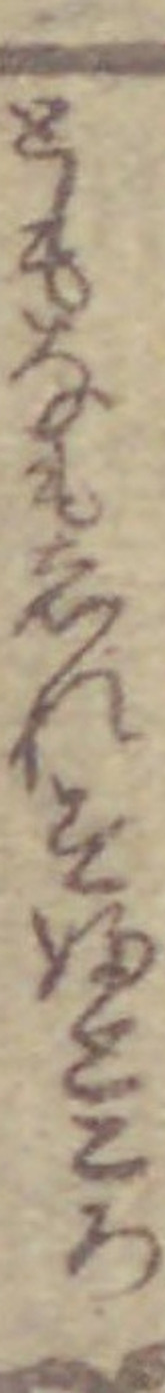ともなもしれすふところ
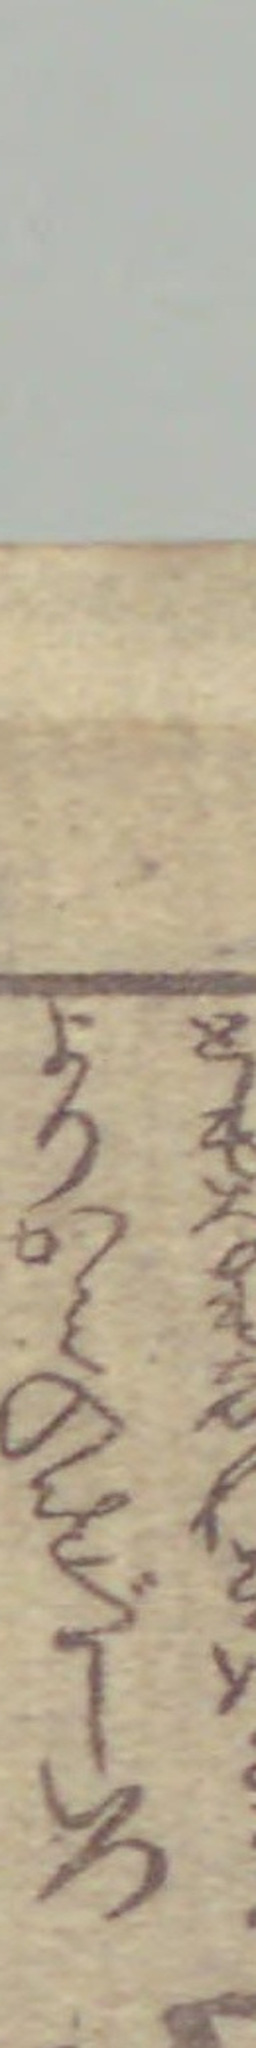よりかみ入をだしいつ
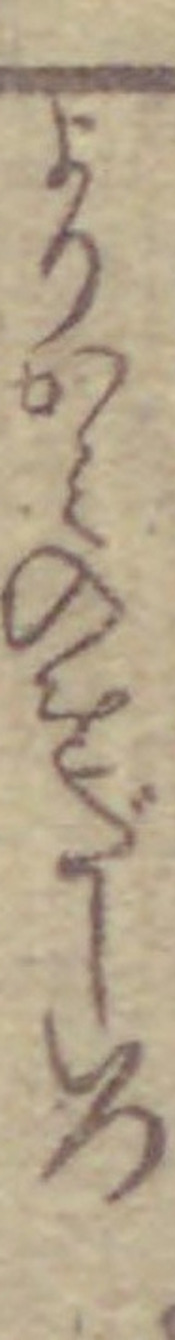よりかみ入をだしいつ
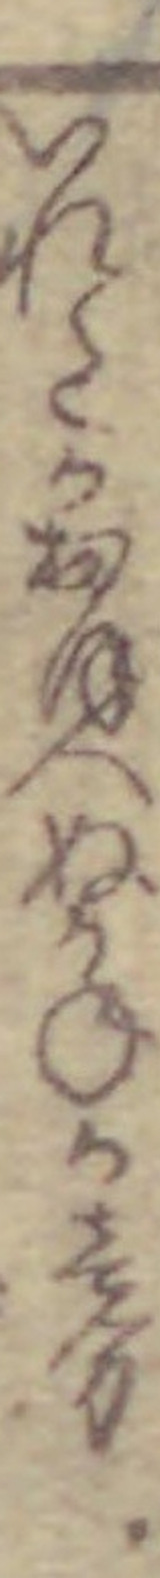いれたかおほへぬかねか壱分
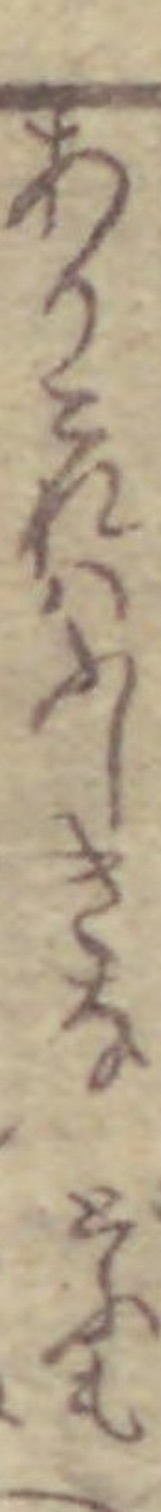ありこれはふしきなどふも
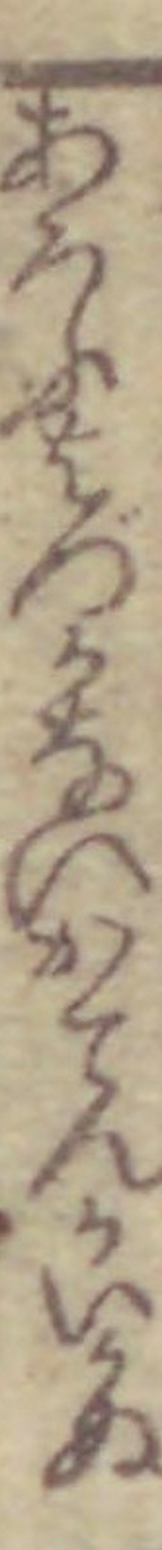あろふはづかないかてんかいかぬ
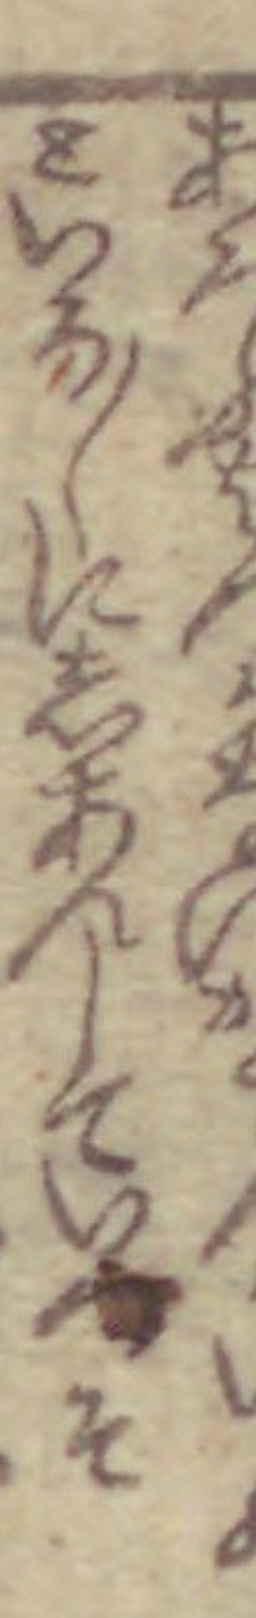といろ〳〵にしあんしていつそ
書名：思事夢濃枕 3巻
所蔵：国立国会図書館 National Diet Library, JAPAN
